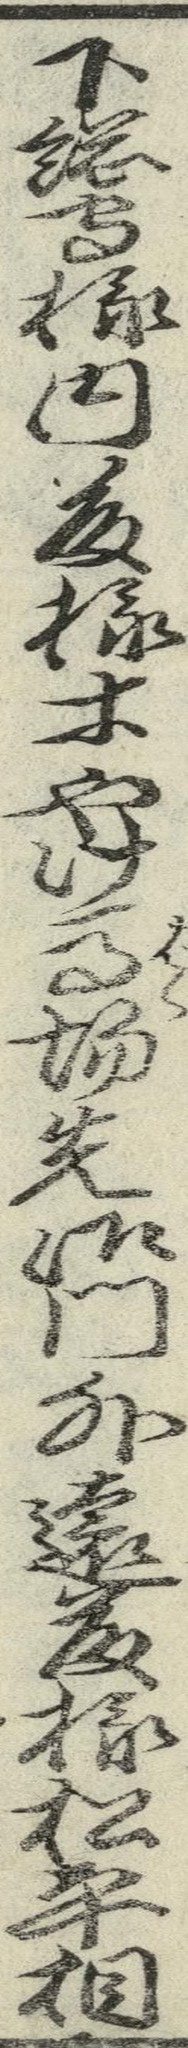下総守様内藤様等やけ馬場先御門外遠藤様松平相
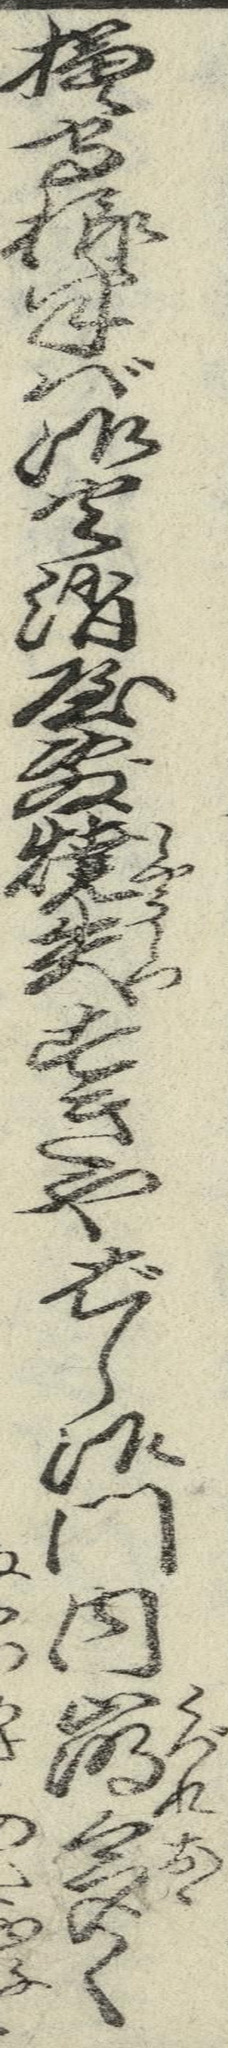模守様半ば御火消屋敷焼失すきやばし御門内崩多く
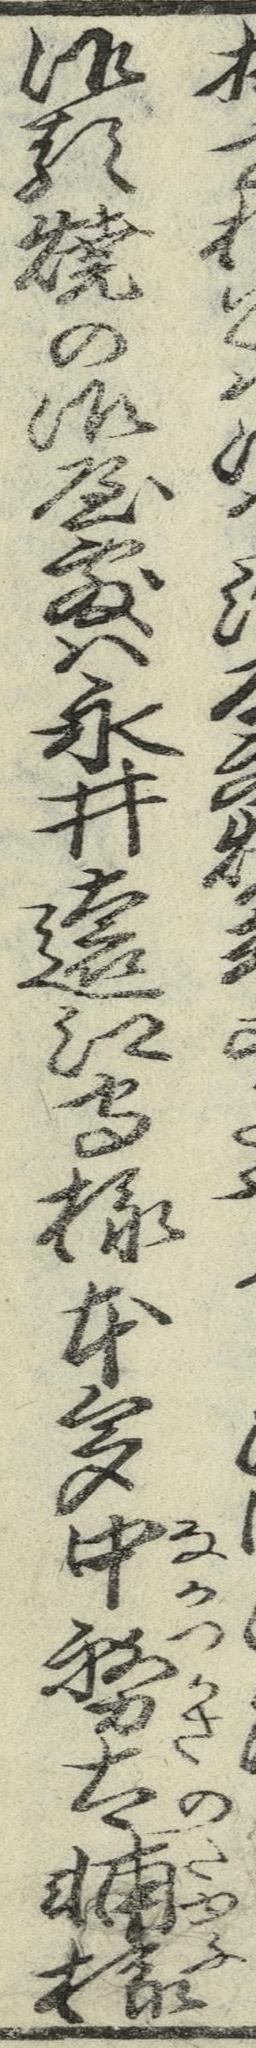御類焼の御屋敷は永井遠江守様本多中務太輔様

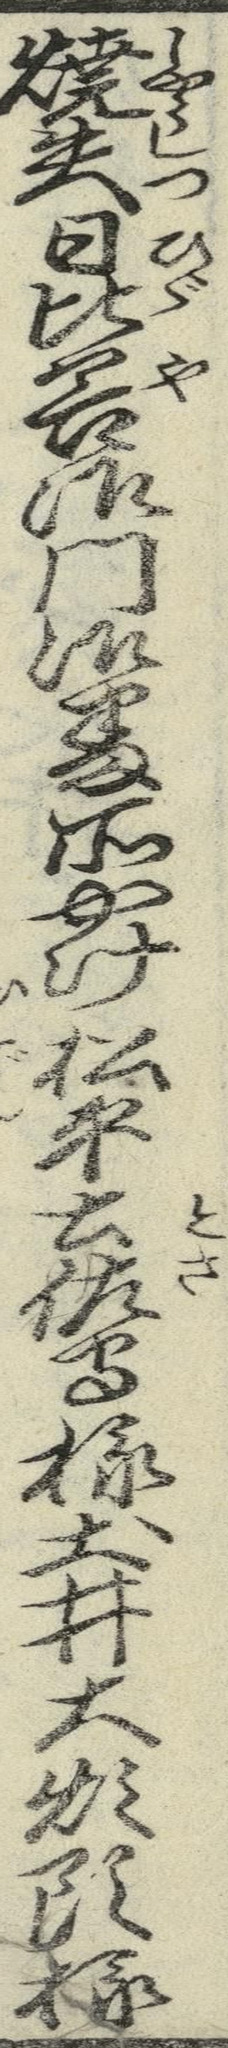焼失日比谷御門御番所やけ松平土佐守様土井大炊頭様
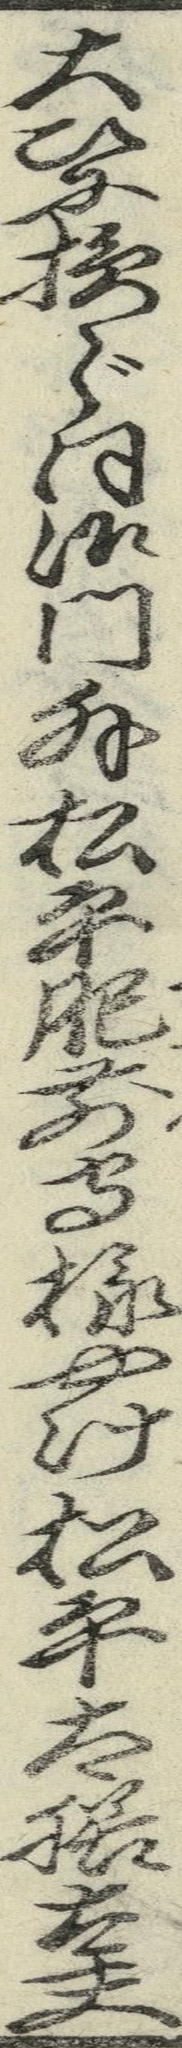大ひに損じ同御門外松平肥前守様やけ松平大膳大夫
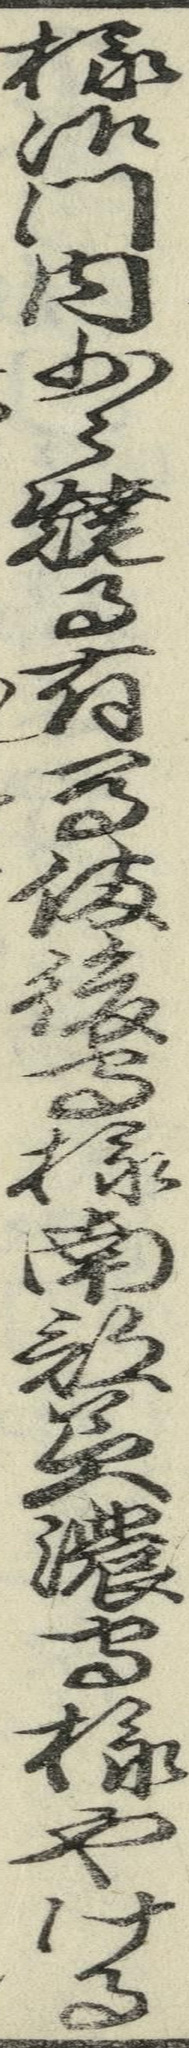様御門内少々焼る有馬備後守様南部美濃守様やける
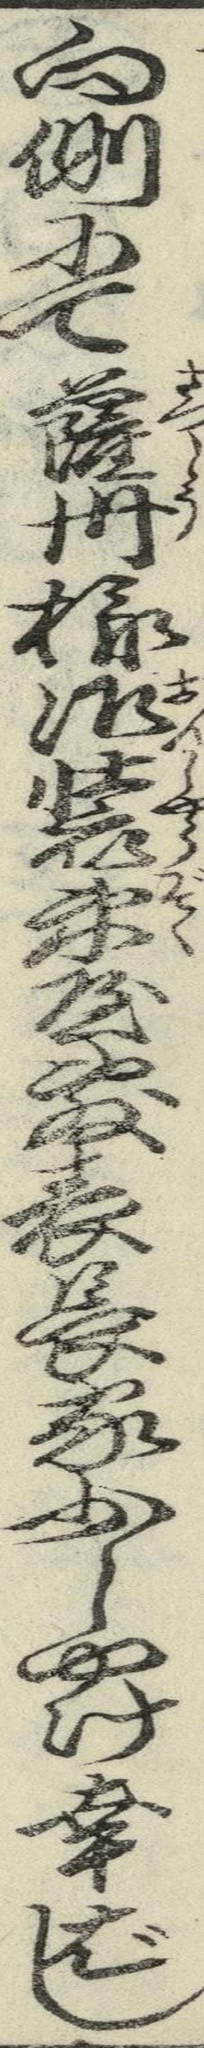向側にて薩州様御装束屋敷表長家少しやけ幸ばし
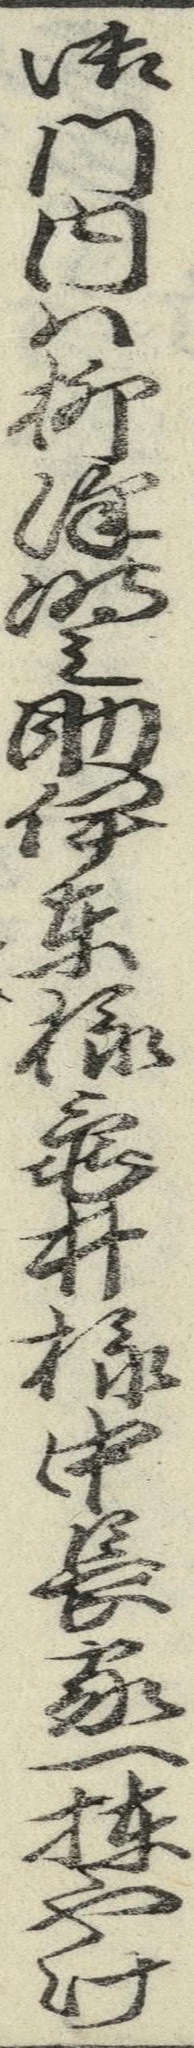御門内は柳澤時之助伊東様亀井様中長家一棟やけ
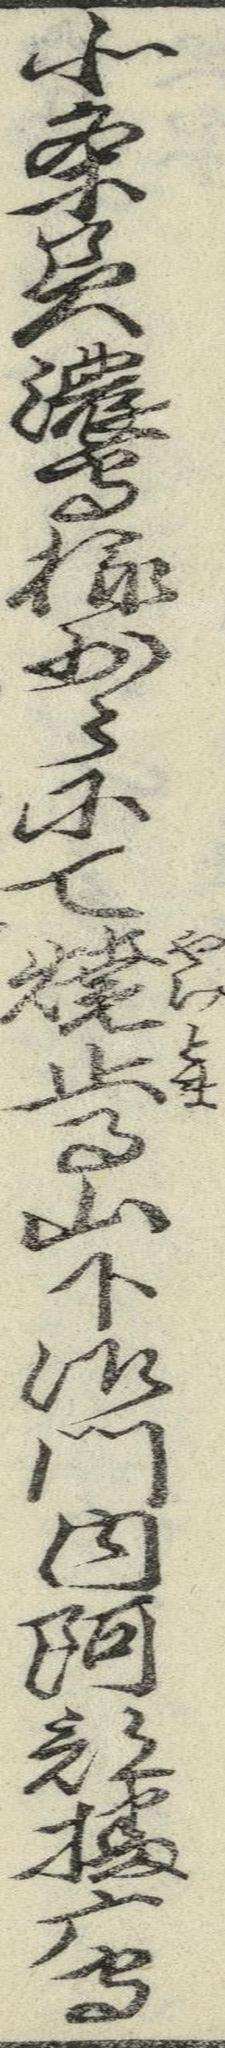北条美濃守様少々にて焼止る山下御門内阿部播磨守
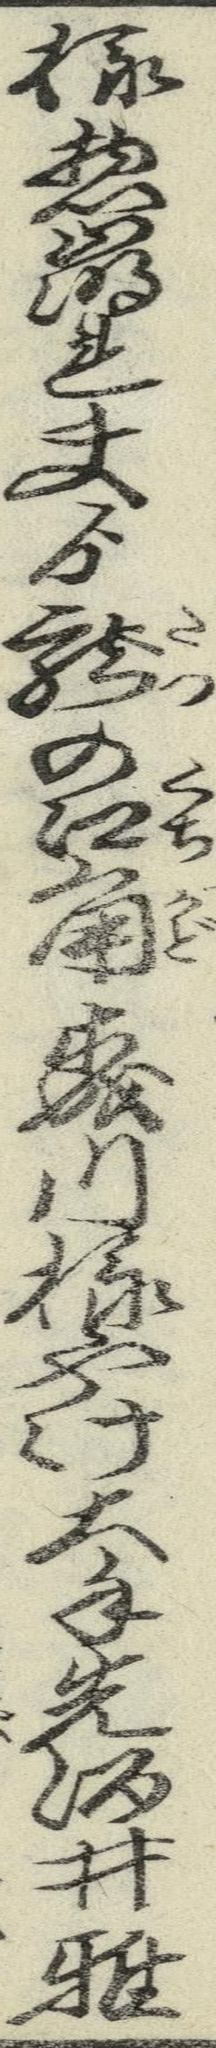様惣崩れ夫ゟ龍の口角森川様やけ大手先酒井雅
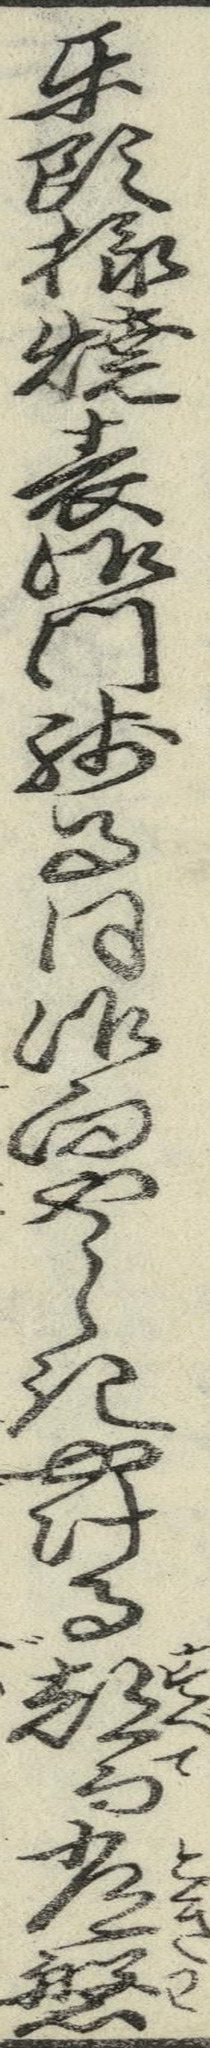楽頭様焼表御門残る同御向やしきやける都而常磐
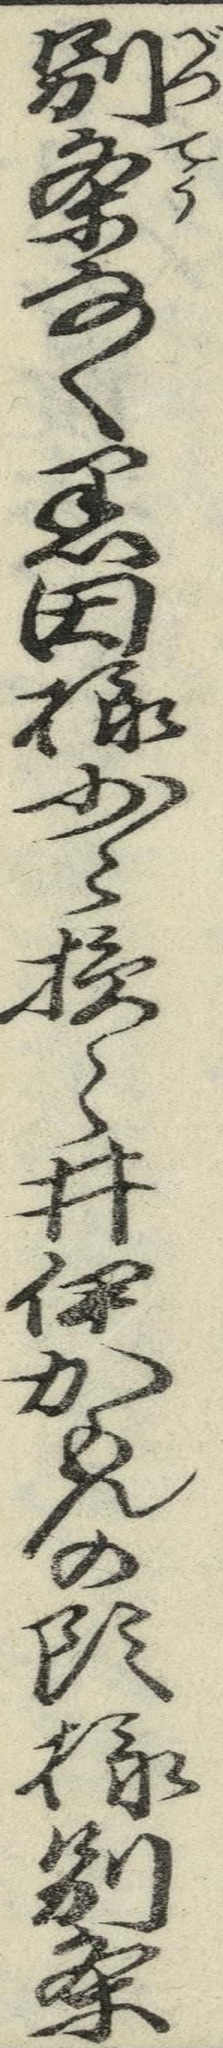別条なく黒田様少々損し井伊かもんの頭様別条
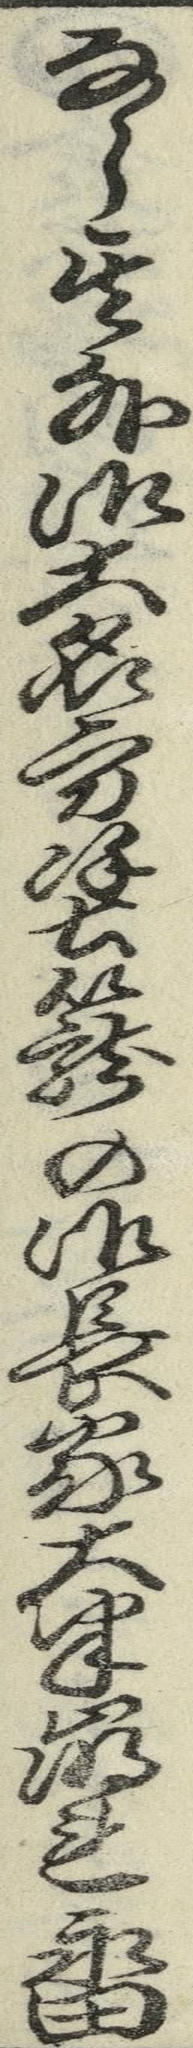なし其外御大名方堅籠の御長家大半崩れ永田
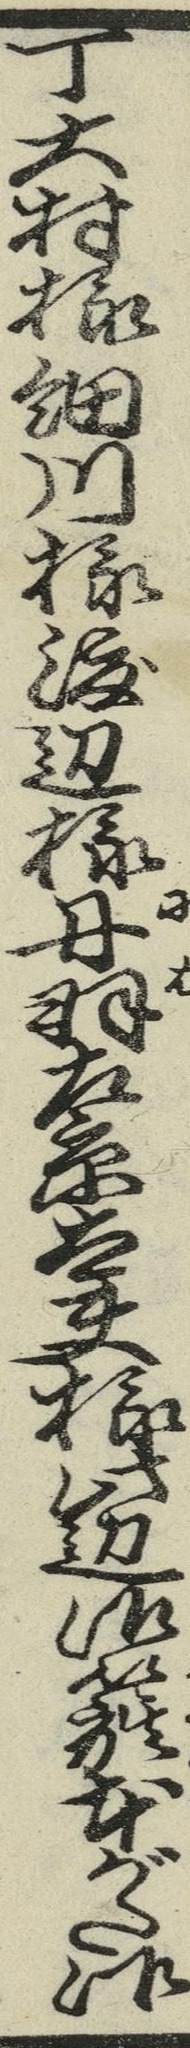丁大村様細川様渡辺様丹羽左京大夫様此辺御旗本がた御
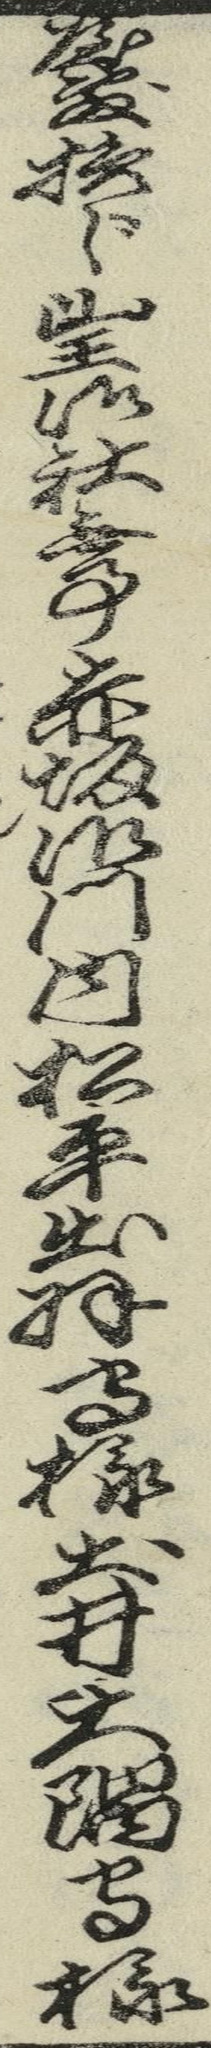屋敷損じ山王御社無事赤坂御門内松平出羽守様土井大隈守様
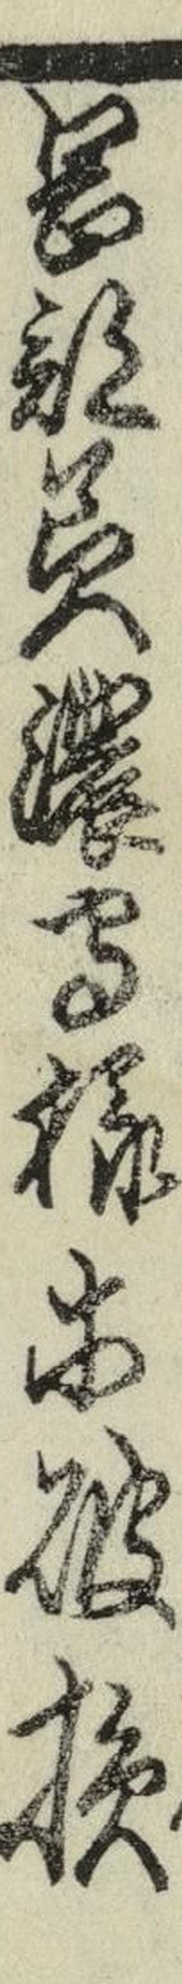岡部美濃守様等破損
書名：地震年代記
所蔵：東京大学地震研究所図書室 Earthquake Research Institute Library, The University of Tokyo, JAPAN
